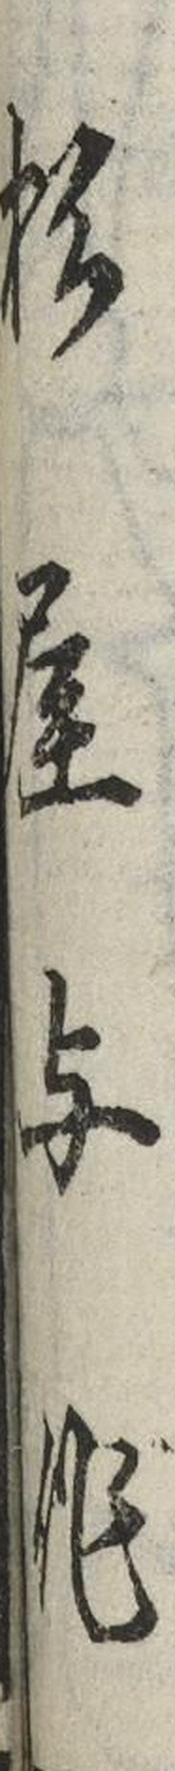松屋与作
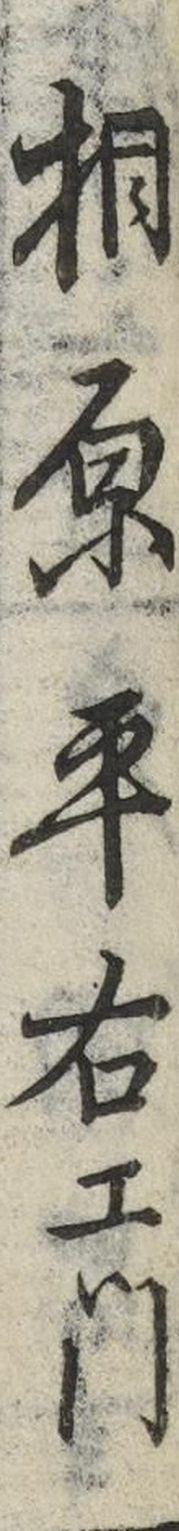桐原平右エ門
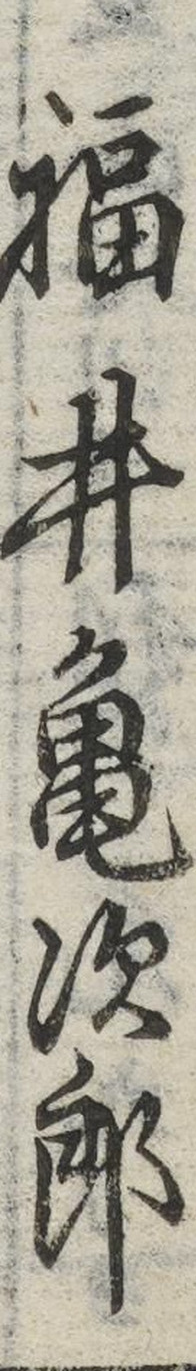福井亀次郎
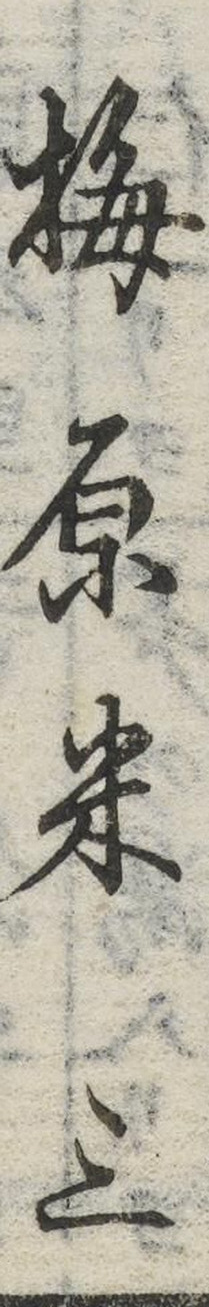梅原米三
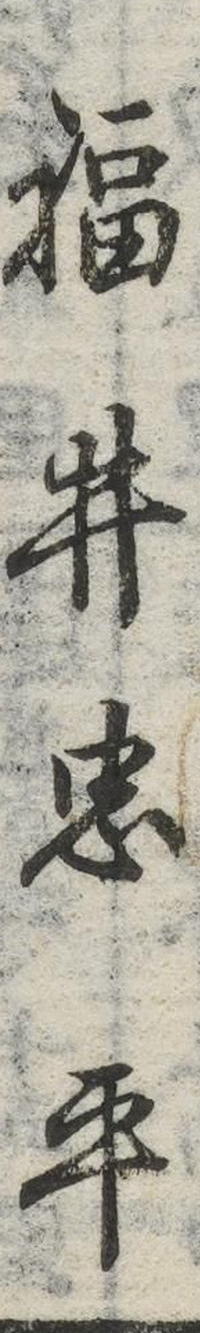福井忠平
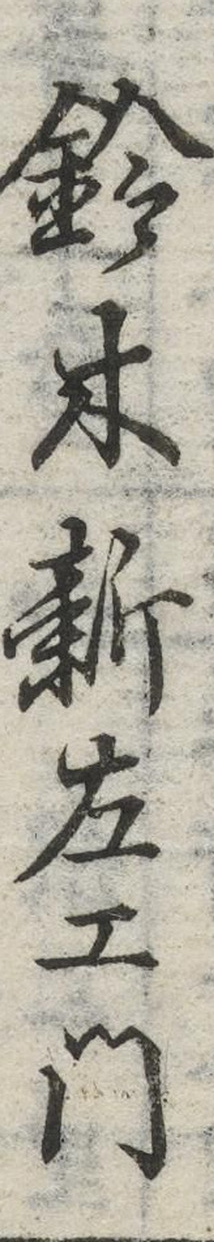鈴木新左エ門
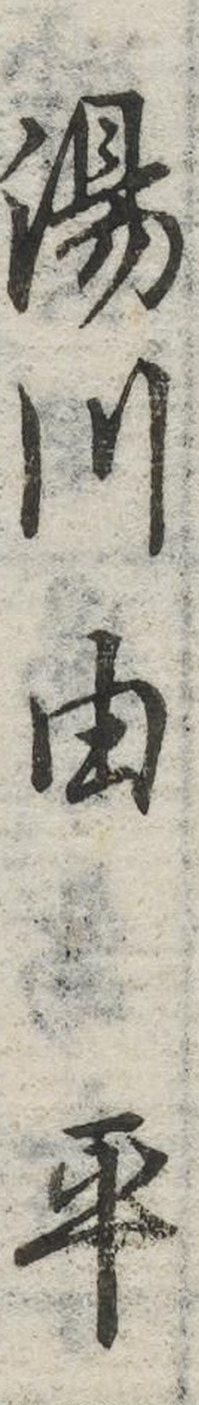湯川由平
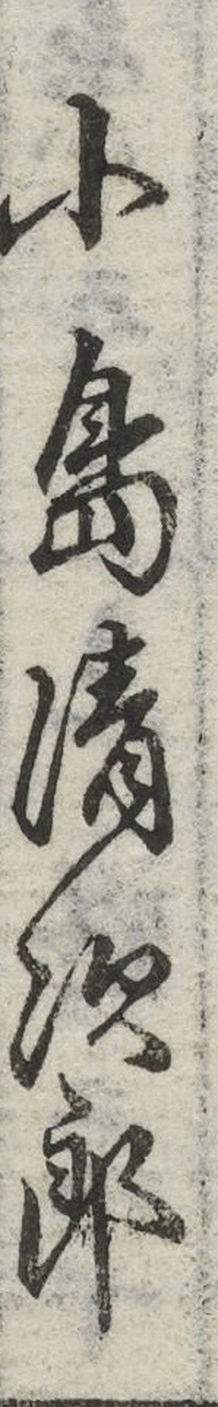小島清次郎
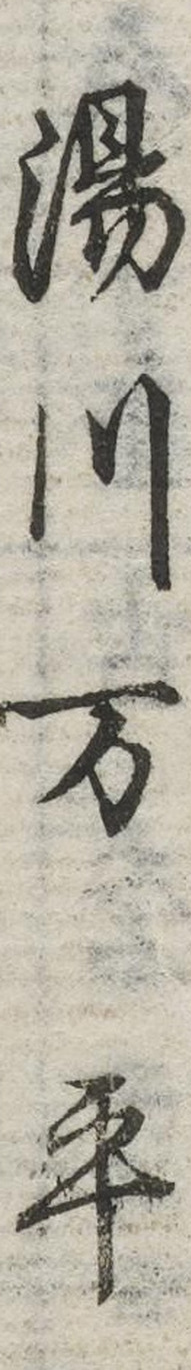湯川万平
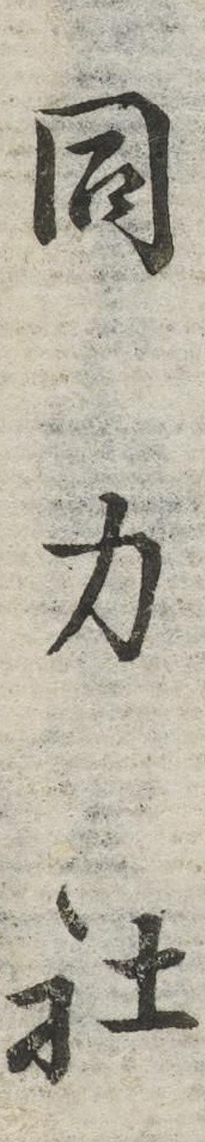同力社

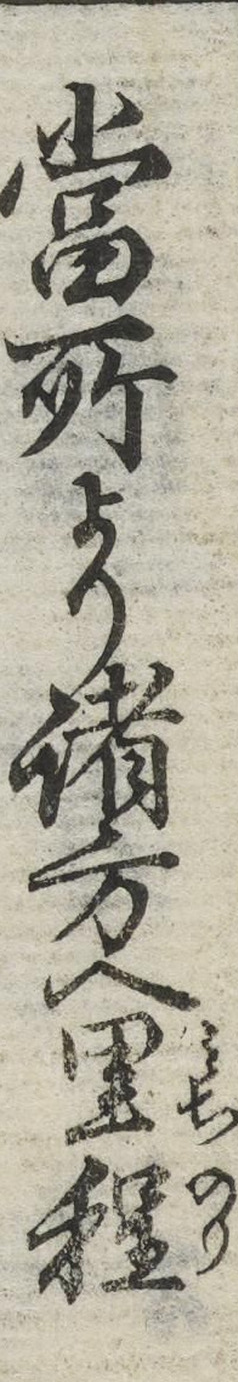当所より諸方へ里程
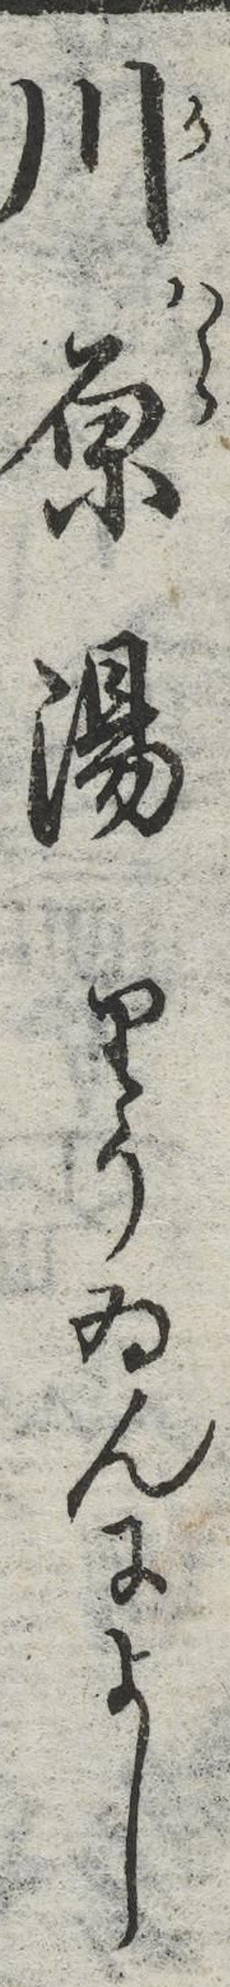川原湯りうゐんによし
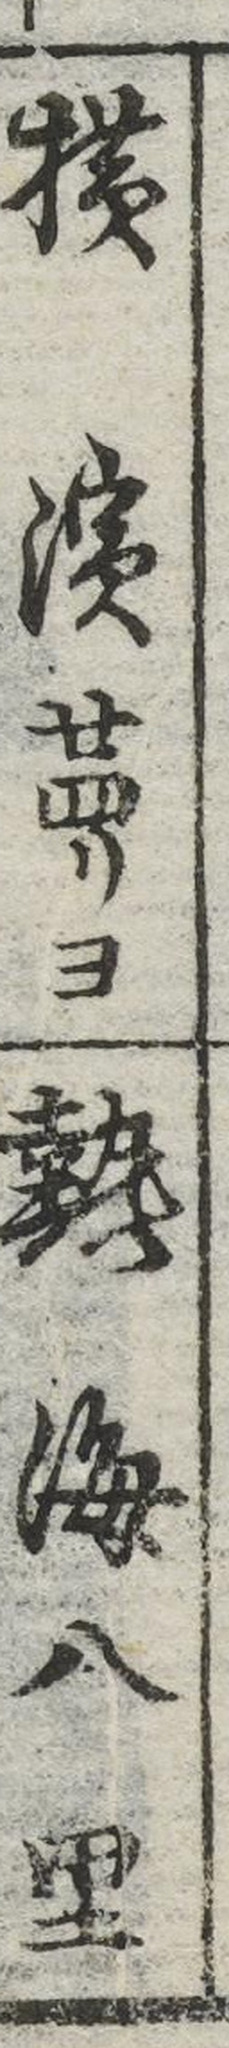横浜廿四リヨ熱海八里
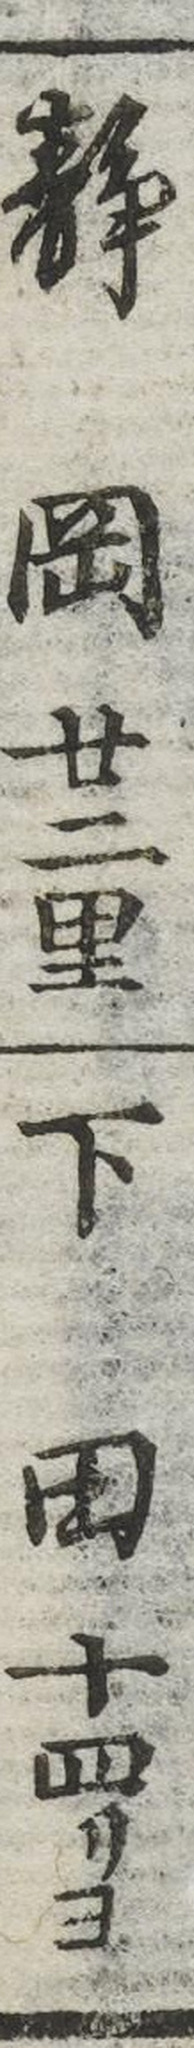静岡廿二里下田十四リヨ
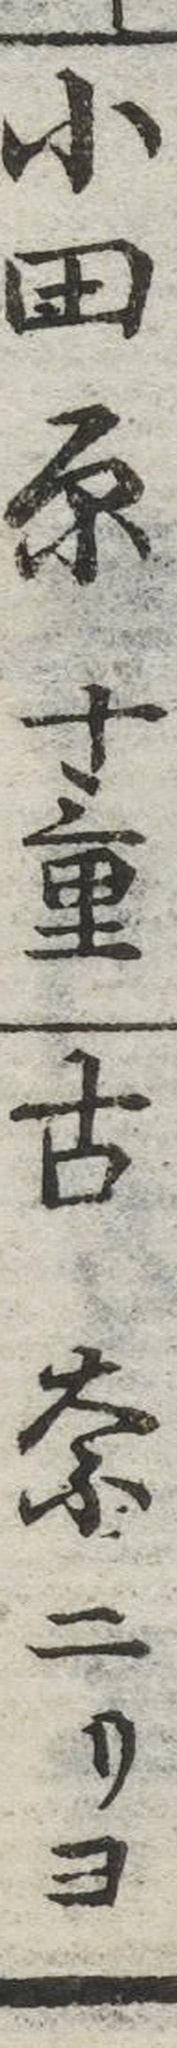小田原十三里古奈二リヨ
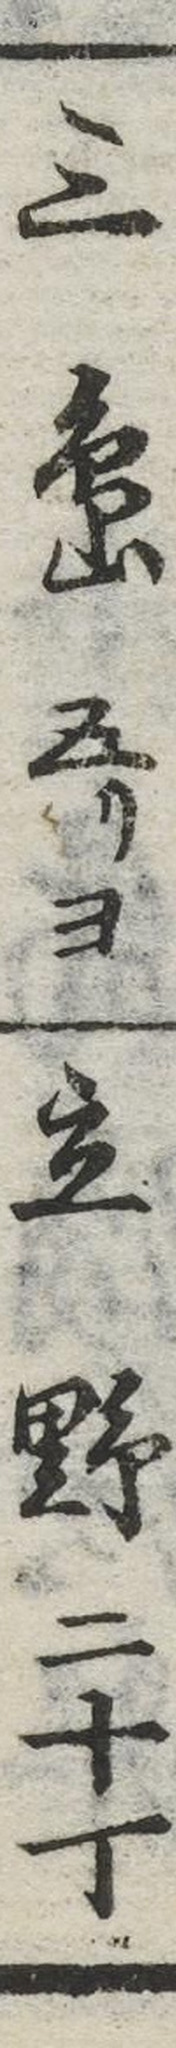三島五リヨ立野二十丁
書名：諸國温泉遊覽記　全
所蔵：東京大学地震研究所図書室 Earthquake Research Institute Library, The University of Tokyo, JAPAN
